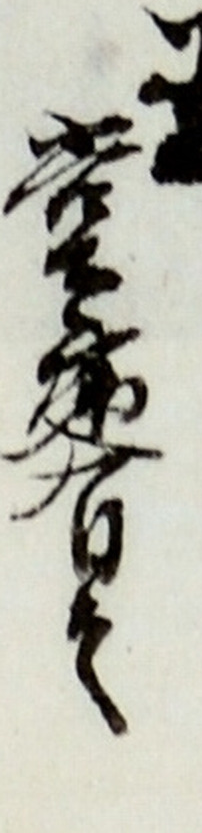堂建有之
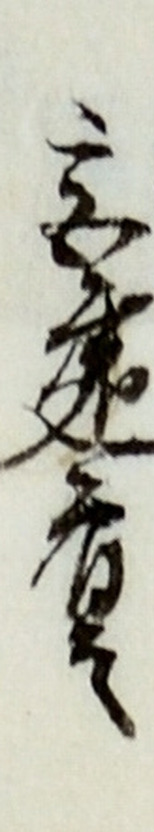宮建有之
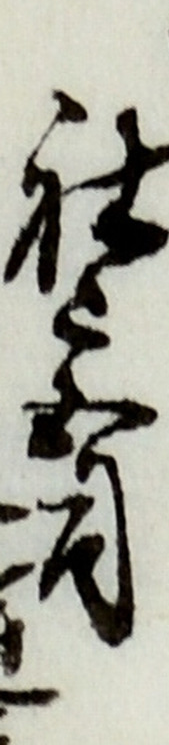社宮司
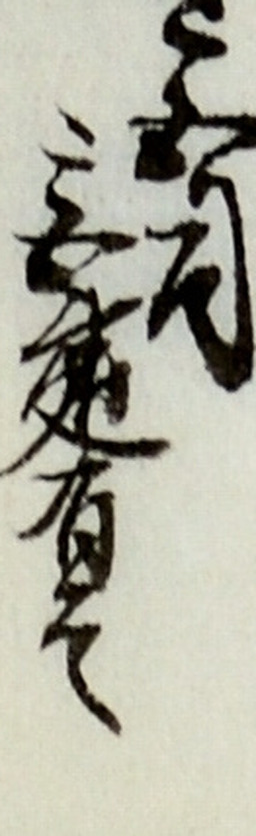宮建有之
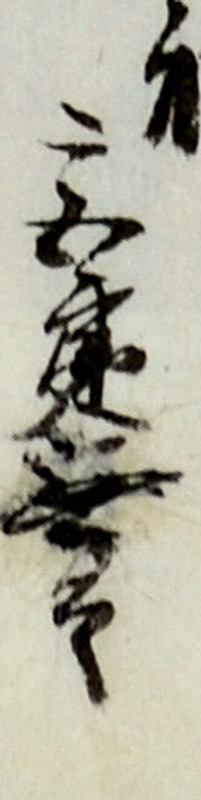宮建無之
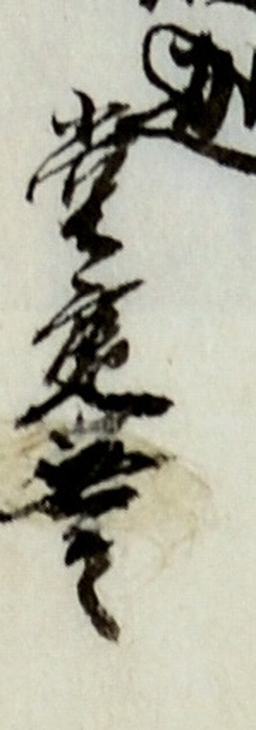堂建無之
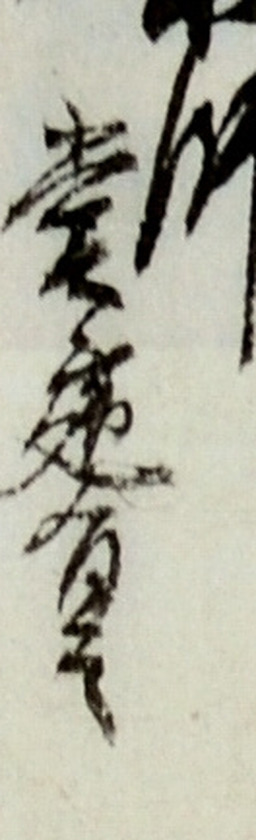堂建有之
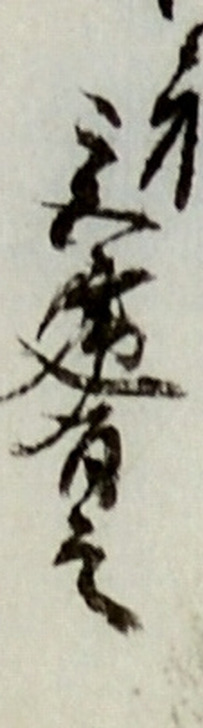宮建有之

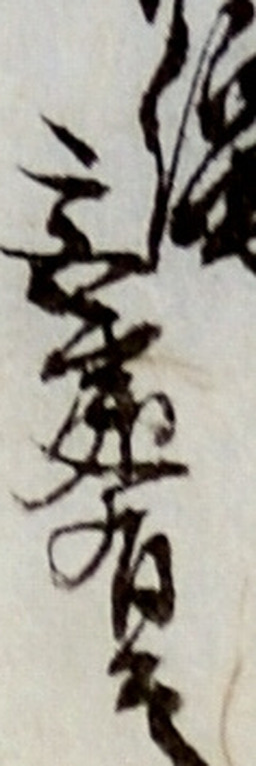宮建有之
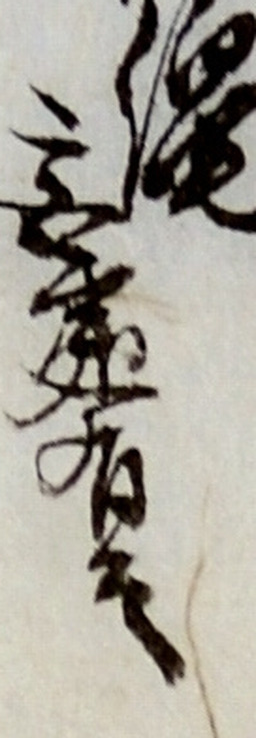宮建有之
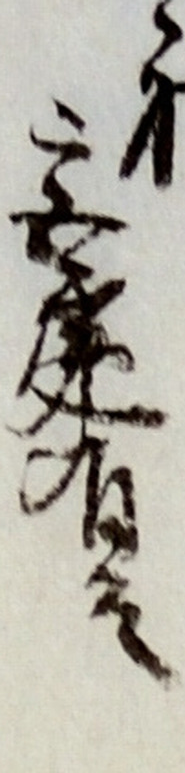宮建有之
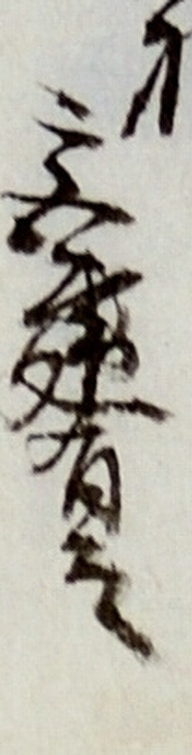宮建有之
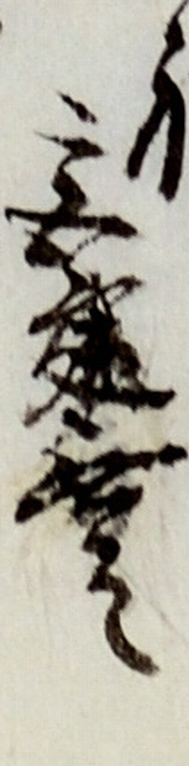宮建無之
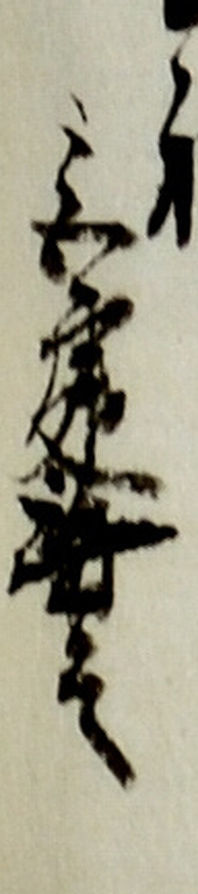宮建無之
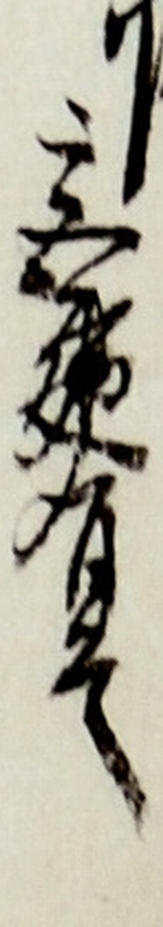宮建有之
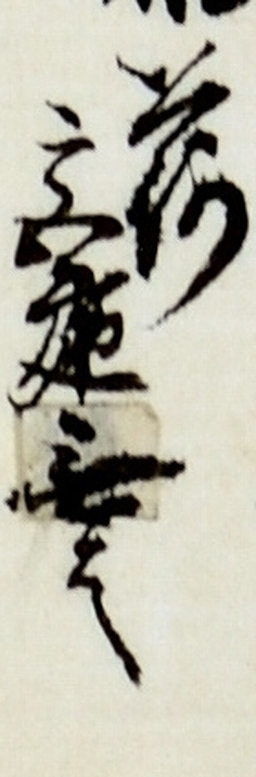宮建無之
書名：御領分中山林社地手控
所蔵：伊那市立高遠町図書館・合同会社AMANE
